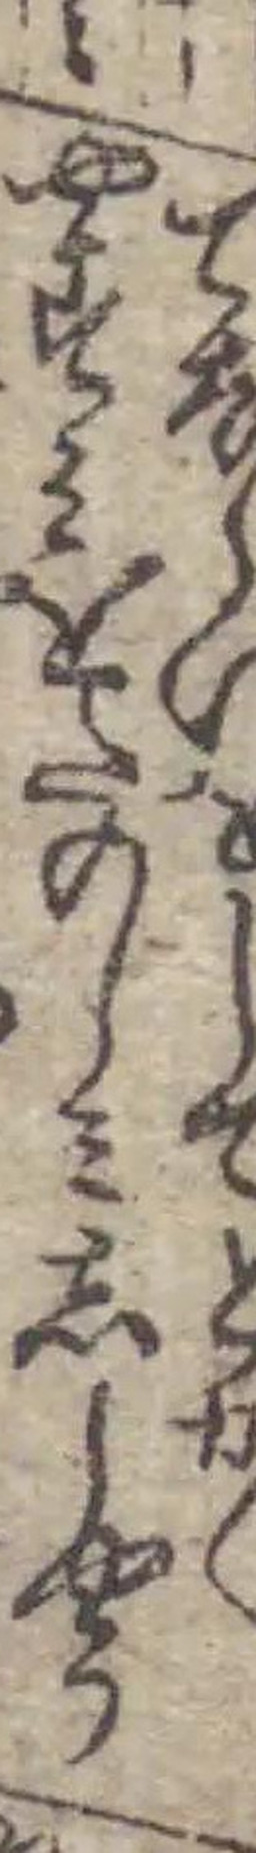やすみをたのしみししやう
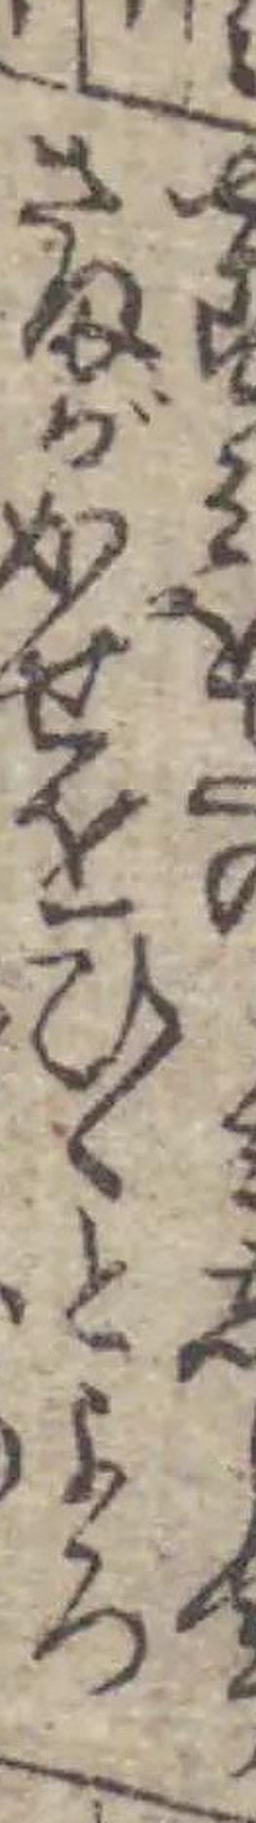さまがかせをひくとよろ
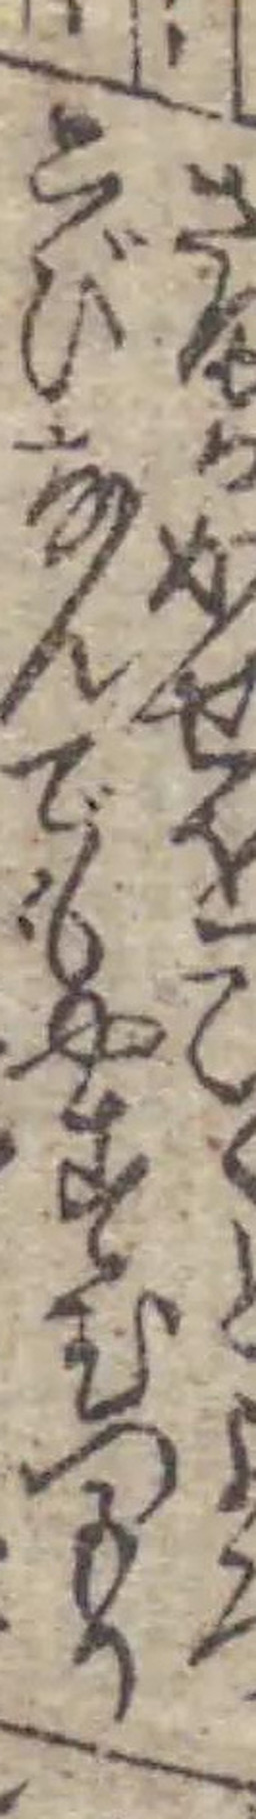こびなんでもやすむつもり
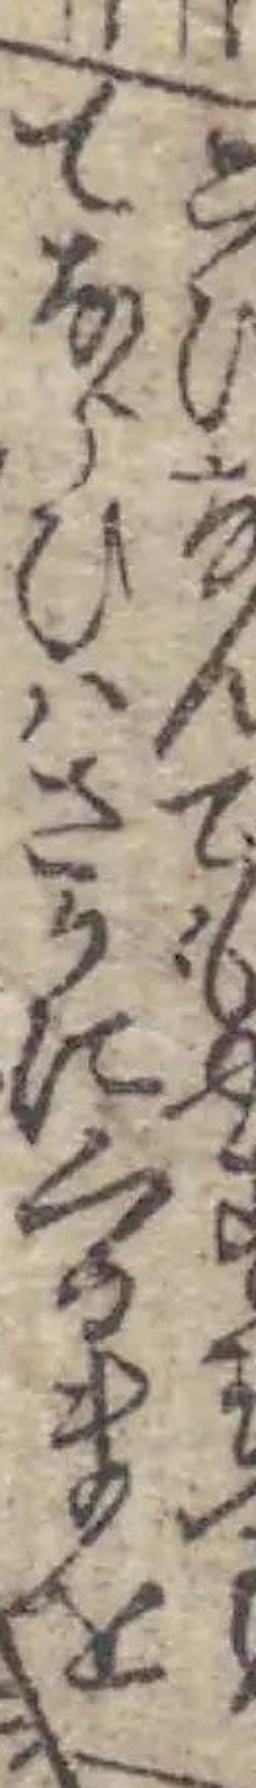てならひはさかにくるまを
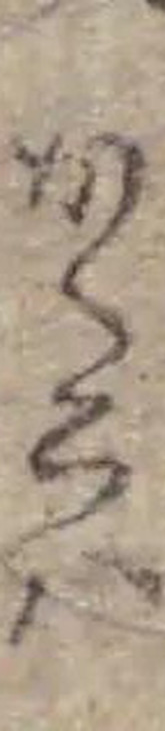かくこは
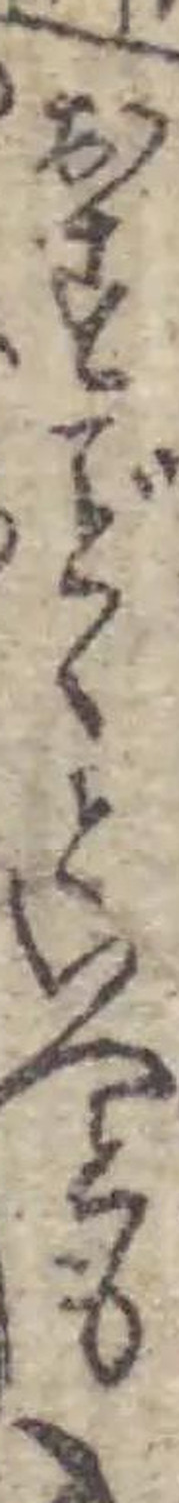おすごとくといへとも
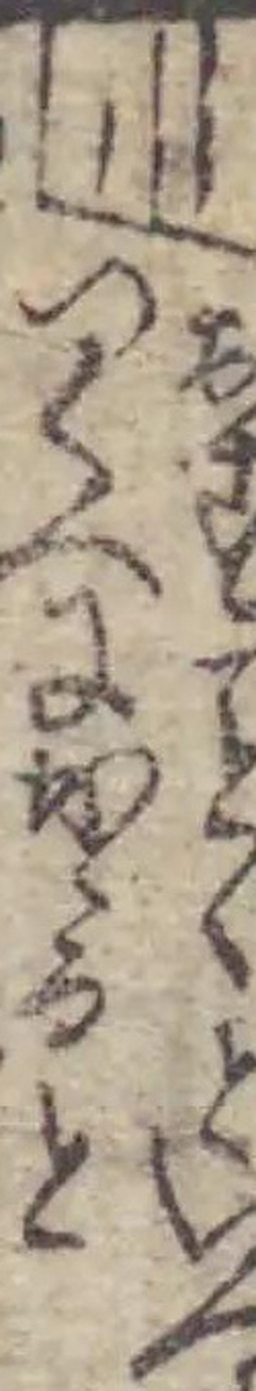つくへにかゝると
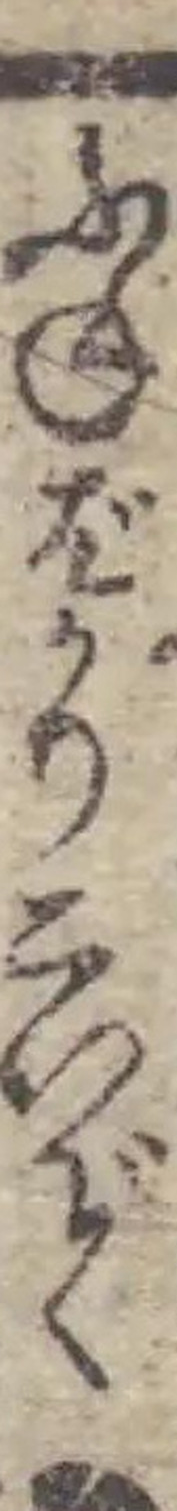ふねばかりこいで
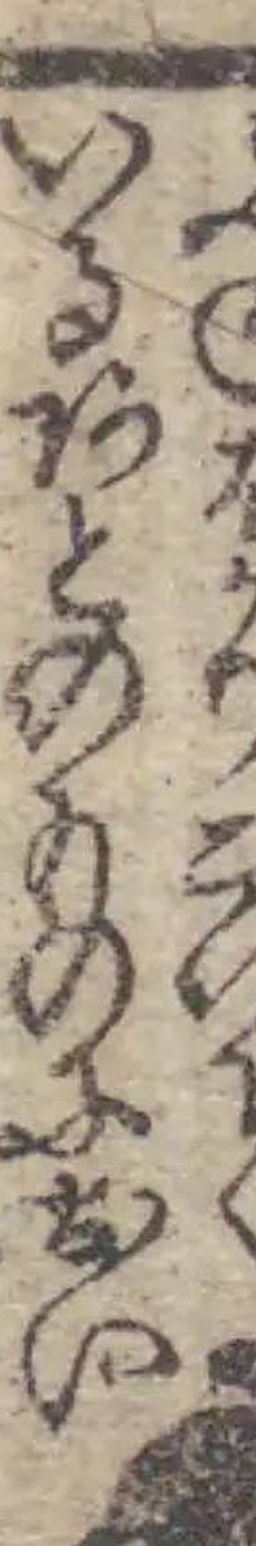いるあとのものにおい
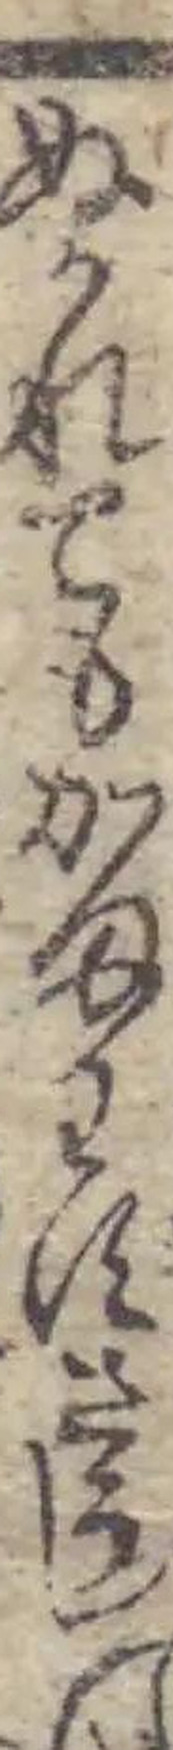ぬかれてもかまわずさうし
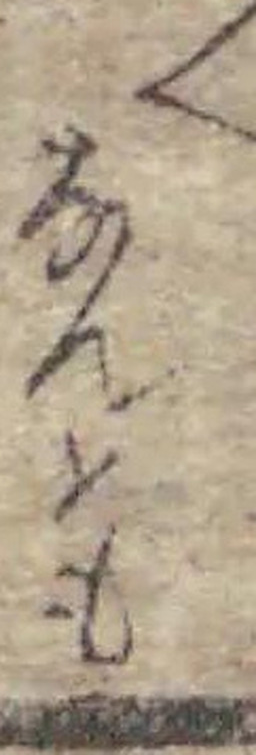なんとも
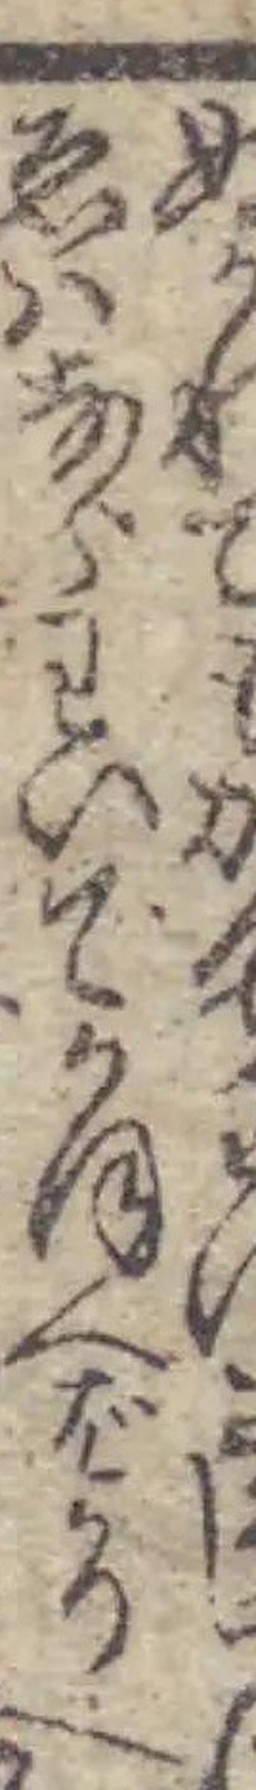ゑはならわいてかほへばかり
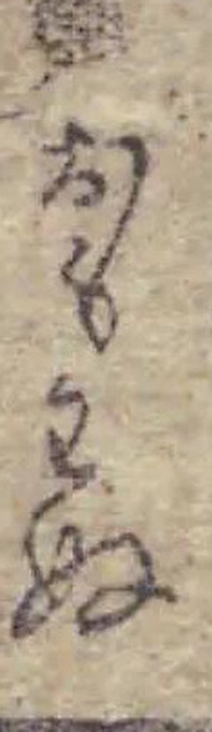おもわぬ
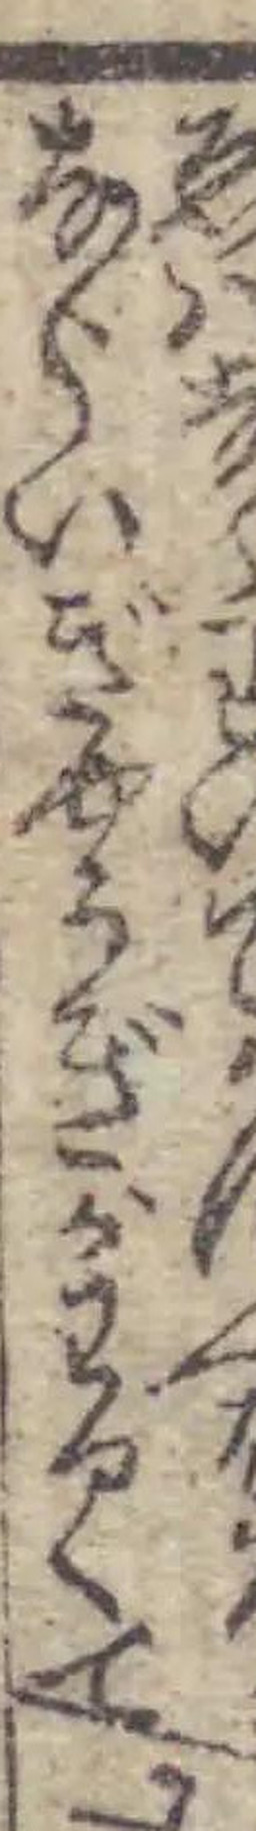ならいぎやうぎがわるくて
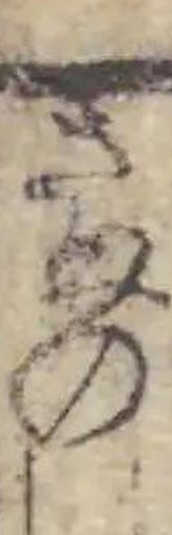さまの
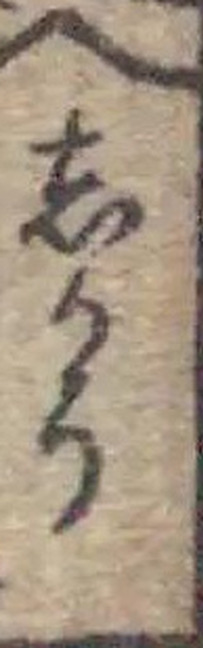しかう
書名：津以曽無弟の甚六 3巻
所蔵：国立国会図書館 National Diet Library, JAPAN
